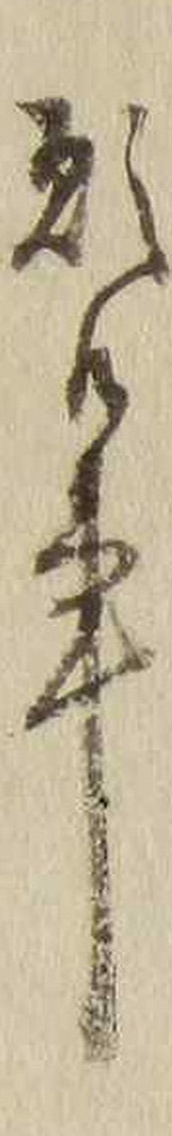願候事

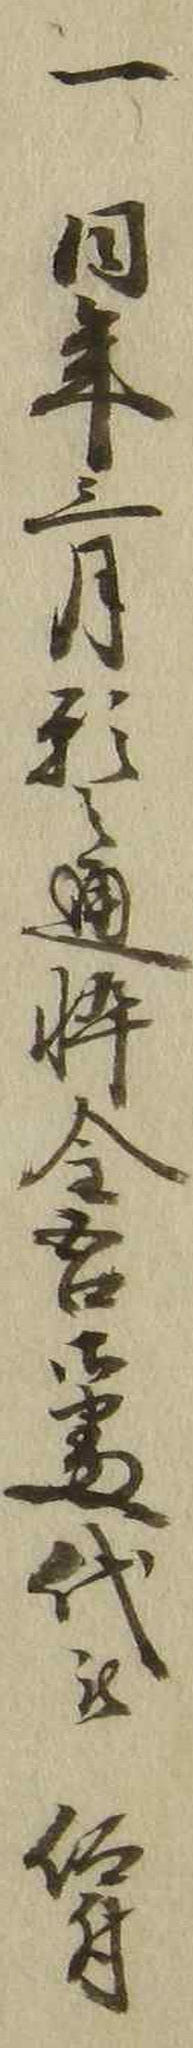一同年三月願之通忰金吾御番代被仰付
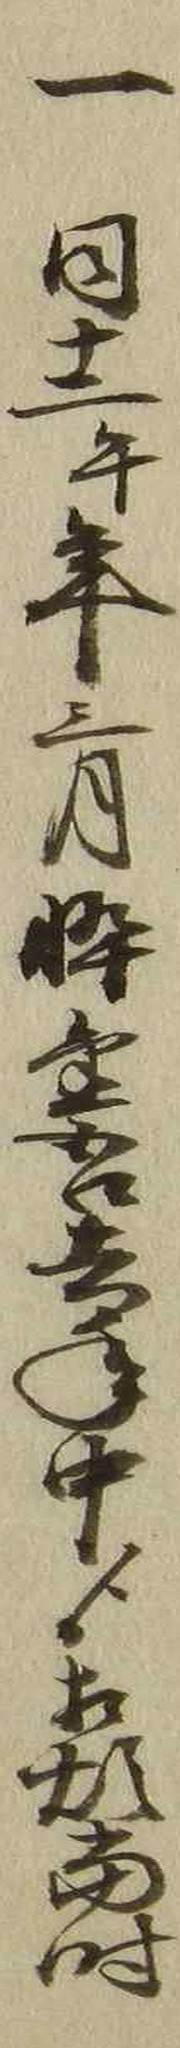一同十二午年三月忰金吾去年中ゟ相煩当時
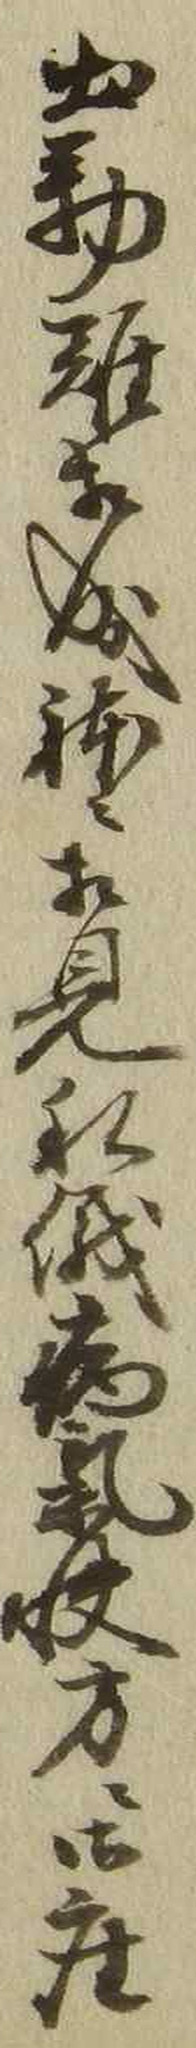出勤難相成躰ニ相見私儀病気快方ニ御座
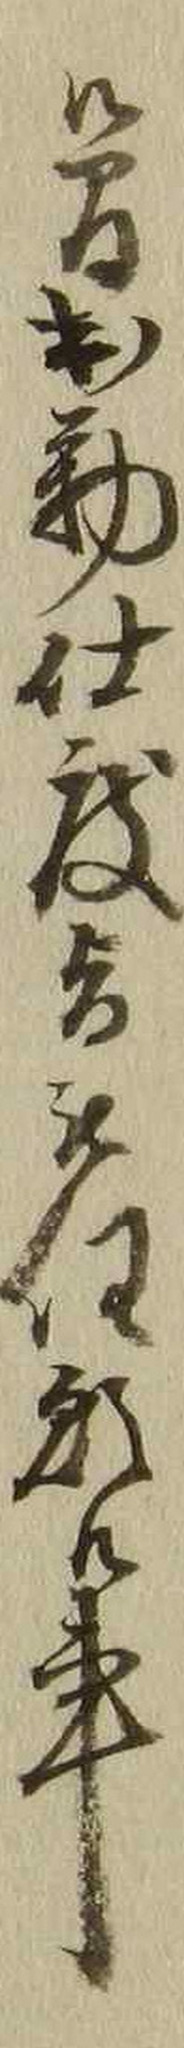候間出勤仕度旨被任願候事
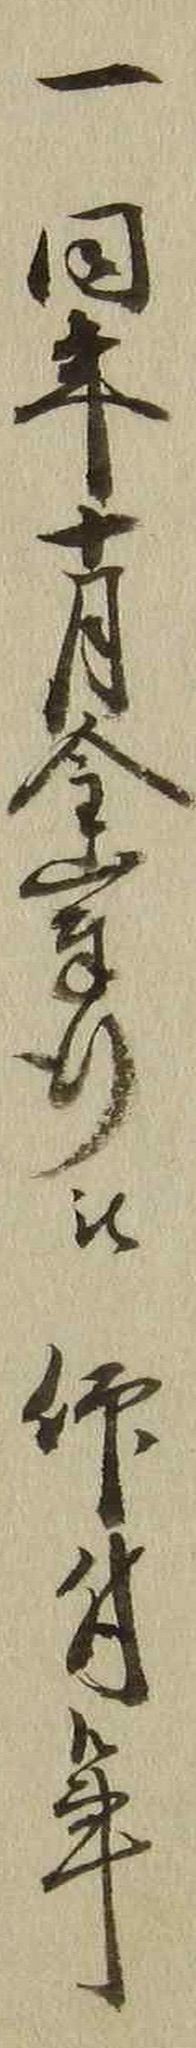一同年十月金山奉行被仰付候事
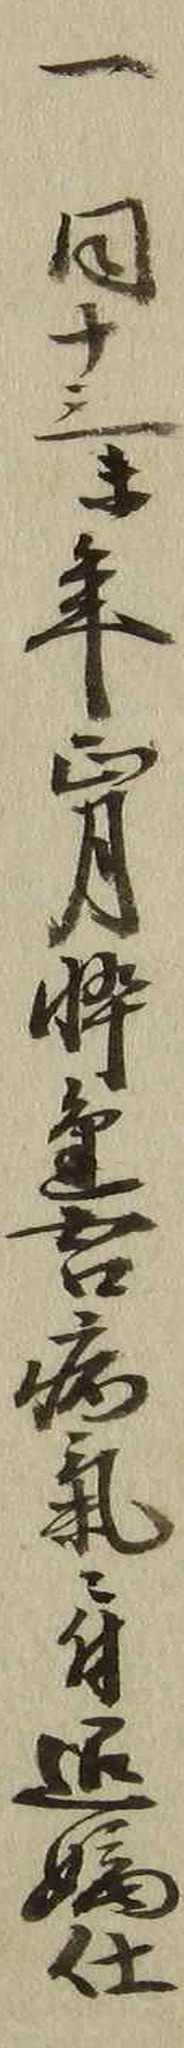一同十三未年正月忰金吾病気ニ付退嫡仕
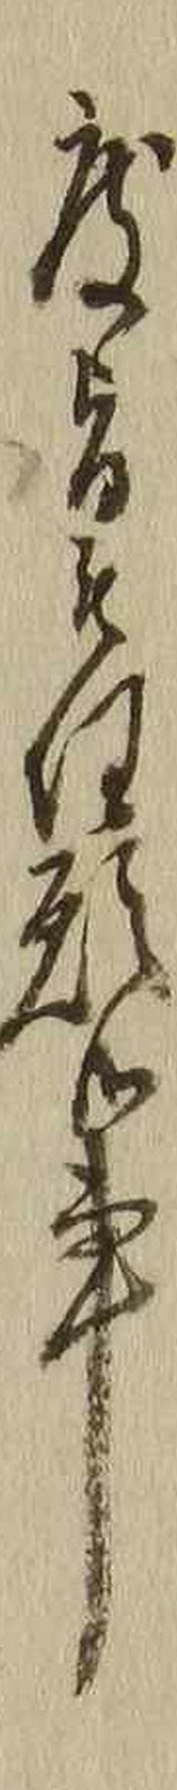度旨任願候事
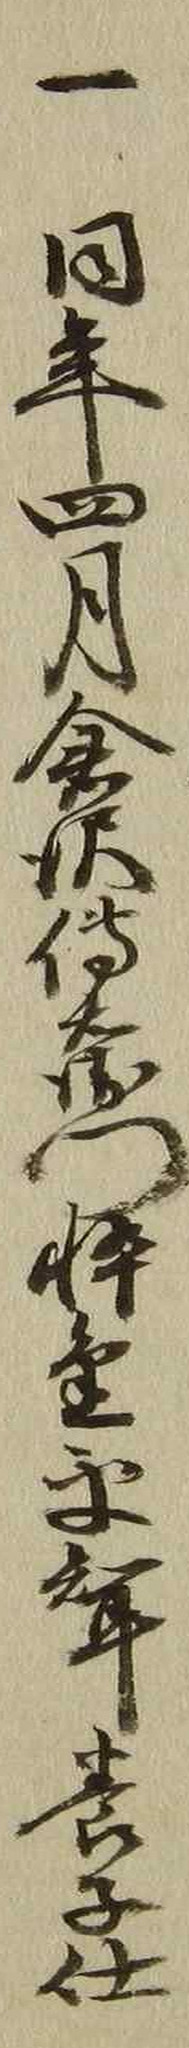一同年四月倉沢伝右衛門忰金平婿養子仕
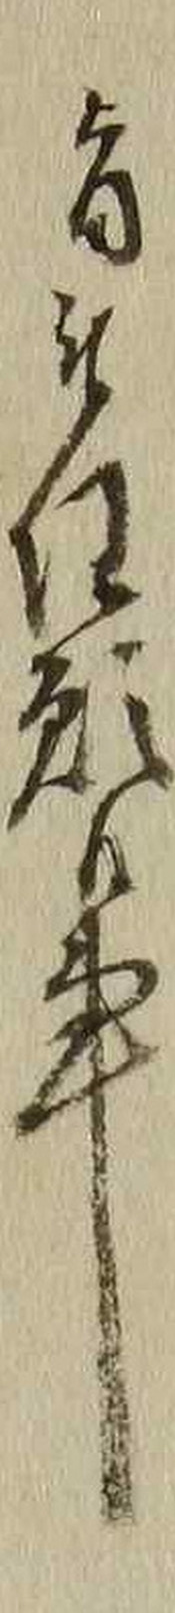旨被任願候事
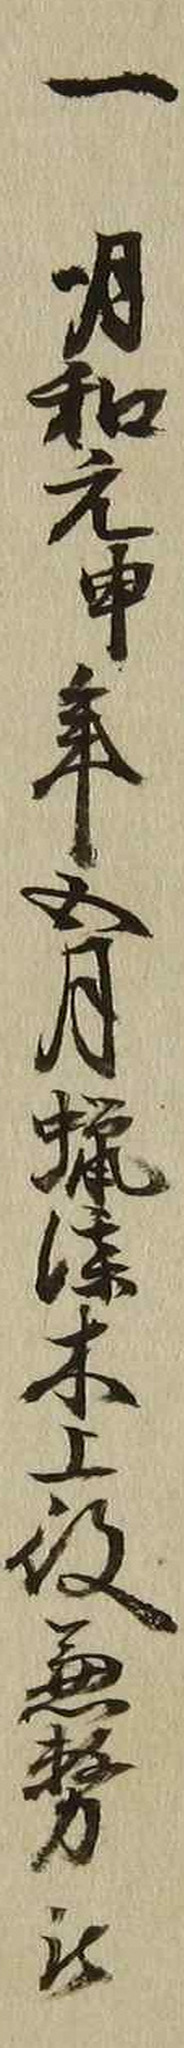一明和元申年五月蠟漆木上役兼務被
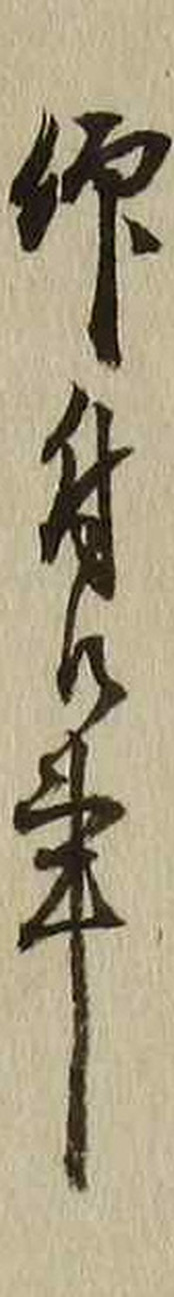仰付候事
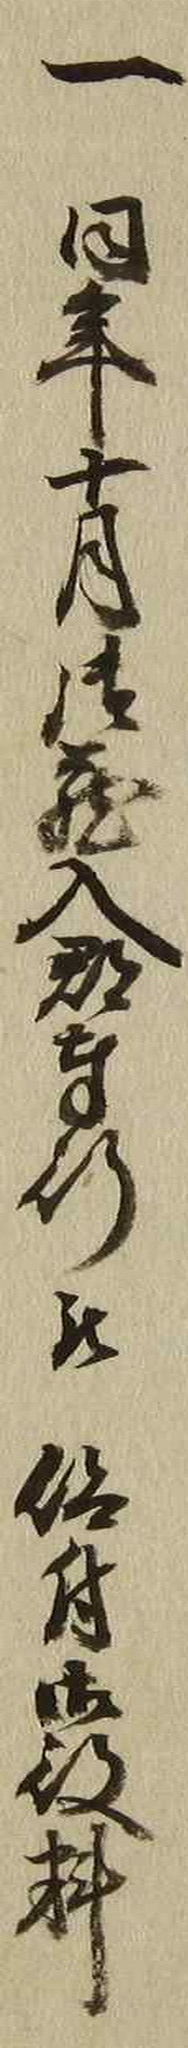一同年十月御蔵入郡奉行被仰付御役料
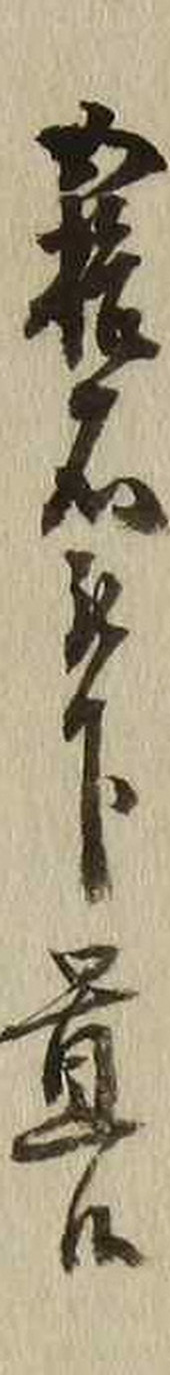五拾石被下置候
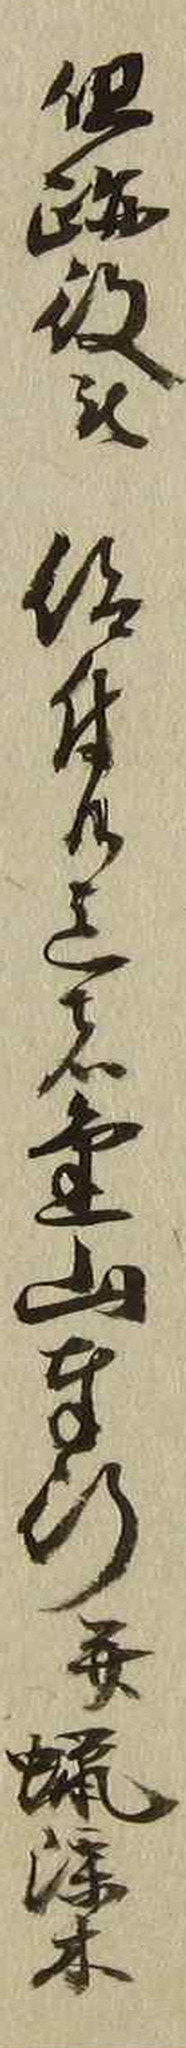但跡役被仰付候迄者金山奉行幷蝋漆木
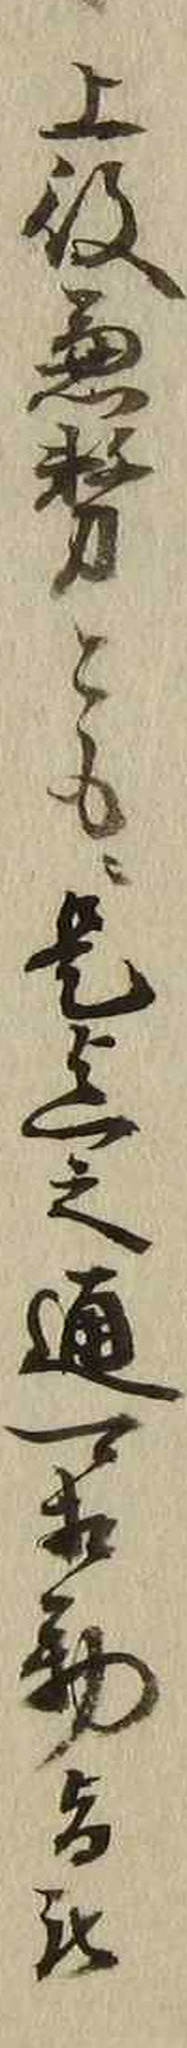上役兼務ともニ是迄之通可相勤旨被
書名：諸士系譜　巻之64　と之部7
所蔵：会津若松市立会津図書館
